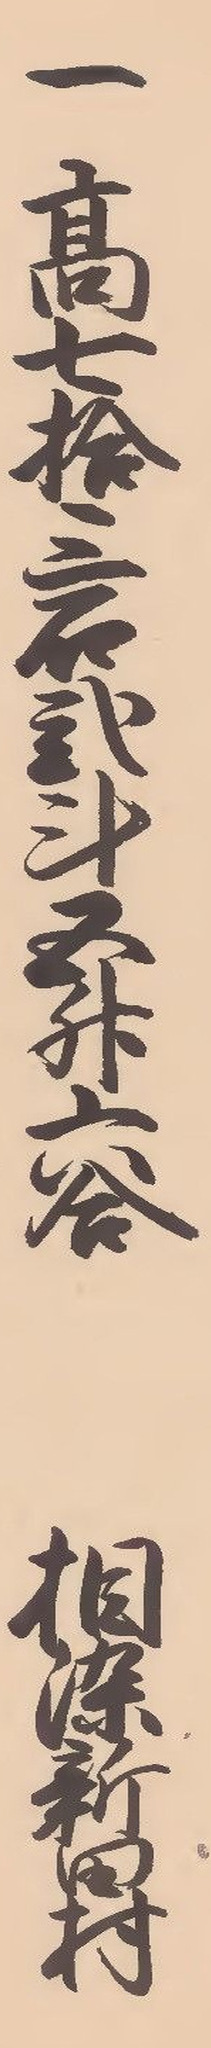一高七拾三石弐斗五升六合相染新田村
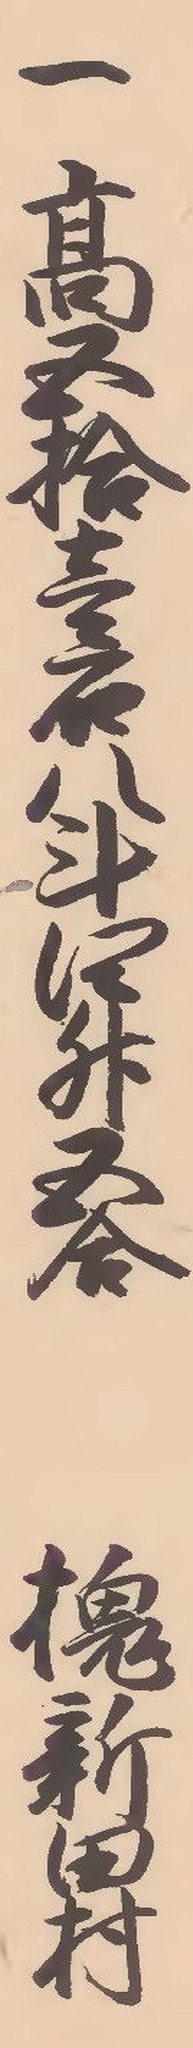一高五拾壱石八斗四升五合愧新田村

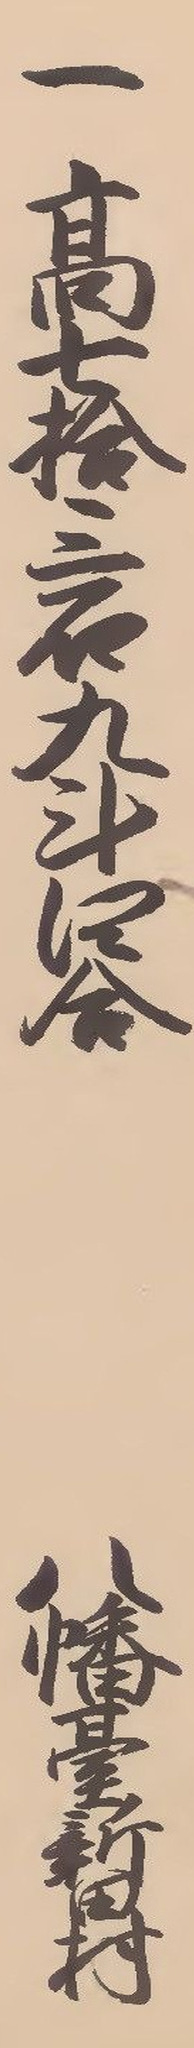一高七拾三石九斗四合八幡台新田村
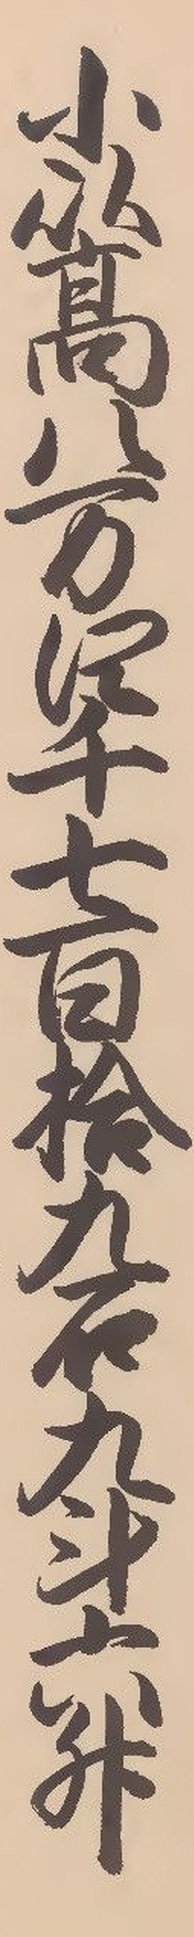小以高八万四千七百拾九石九斗六升
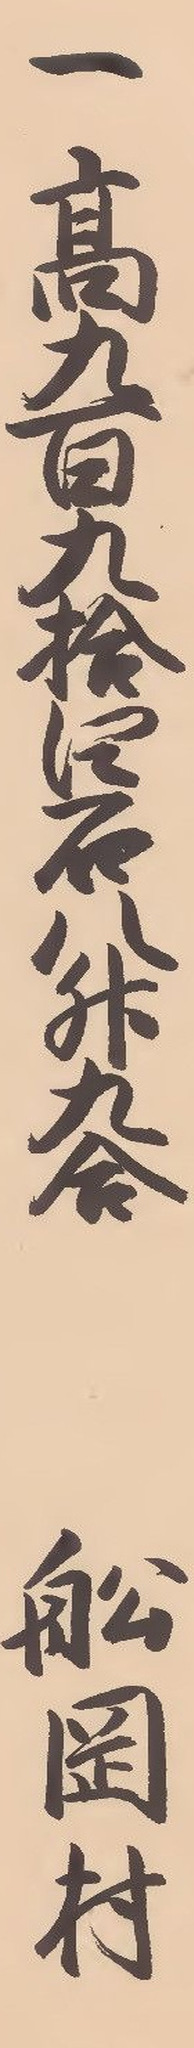一高九百九拾四石八升九合船岡村
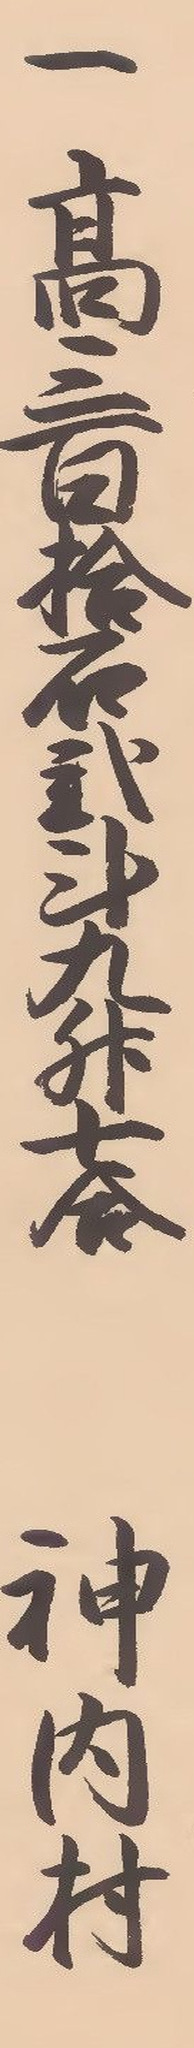一高三百拾石弐斗九升七合神内村
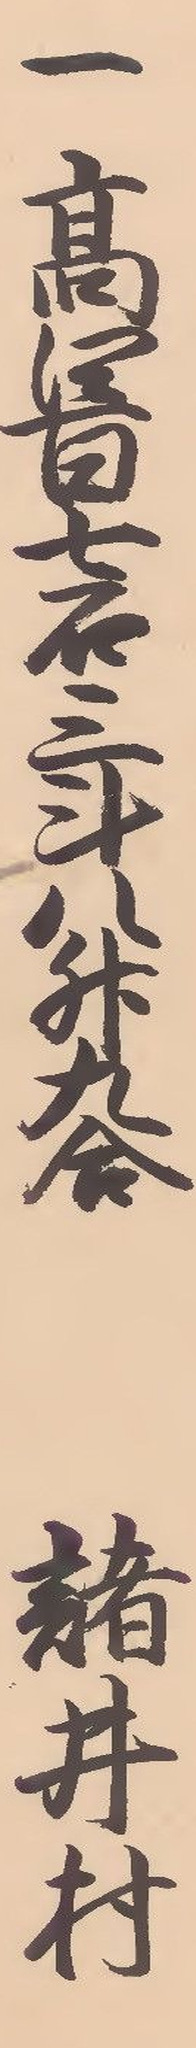一高四百七石三斗八升九合諸井村

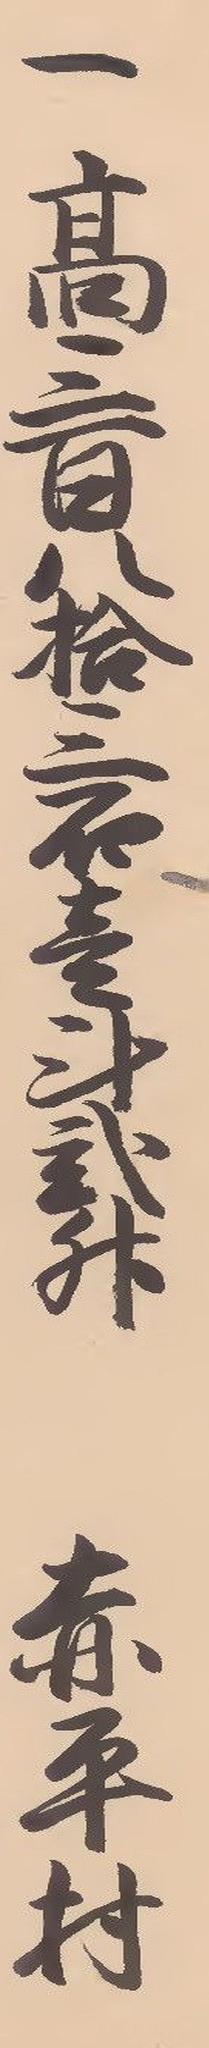一高三百八拾三石壱斗弐升赤平村
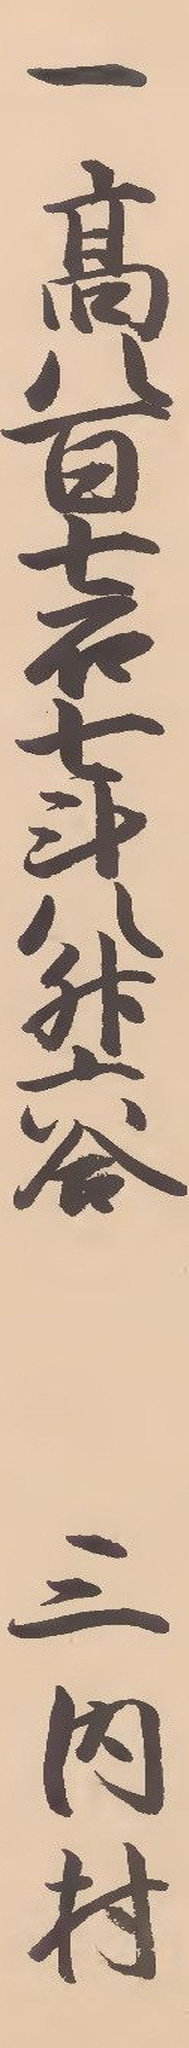一高八百七石七斗八升六合三内村
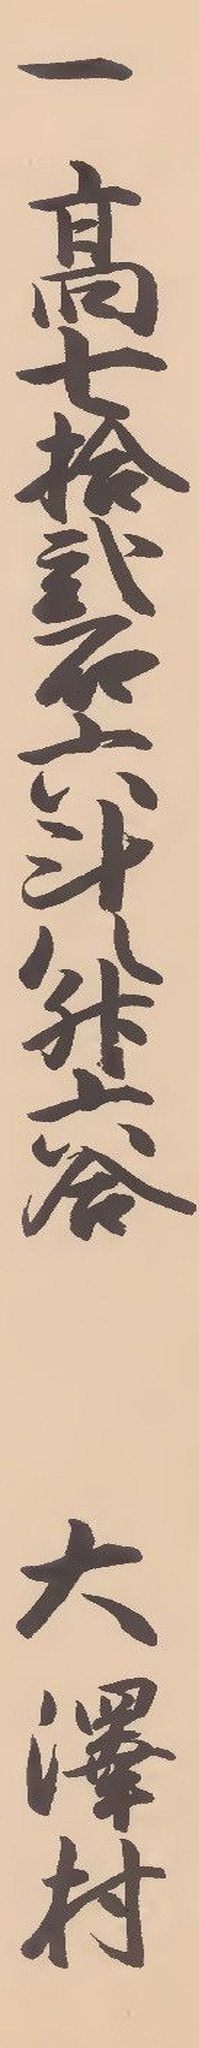一高七拾弐石六斗八升六合大沢村
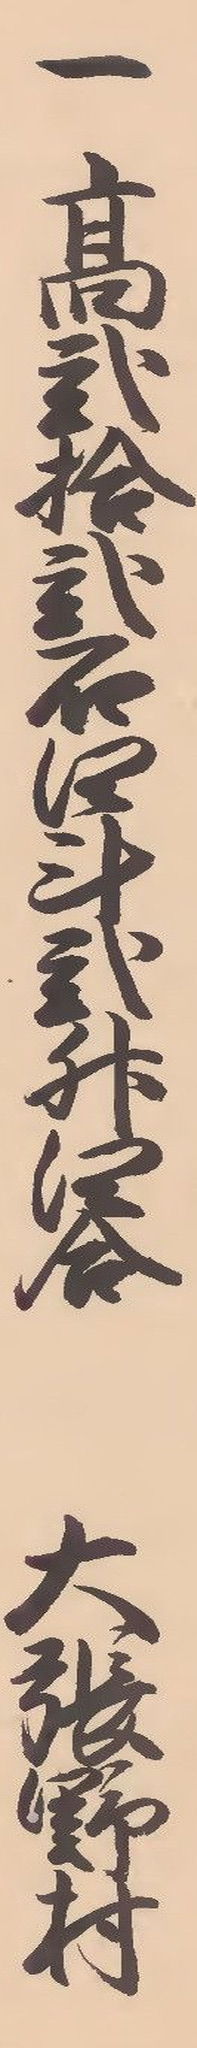一高弐拾弐石四斗弐升四合大張野村
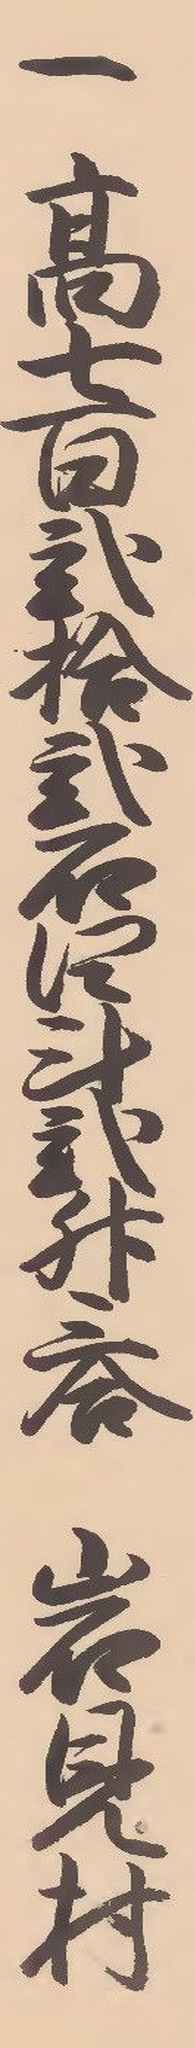一高七百弐拾弐石四斗弐升三合岩見村
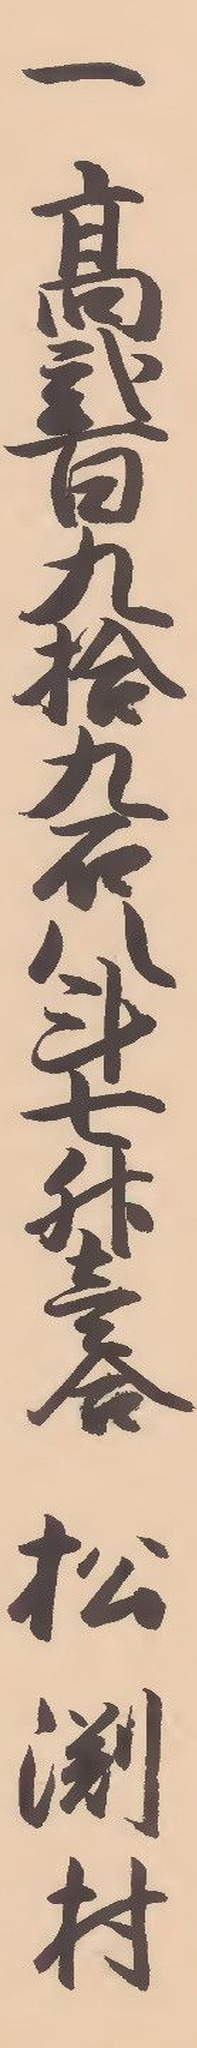一高弐百九拾九石八斗七升壱合松淵村
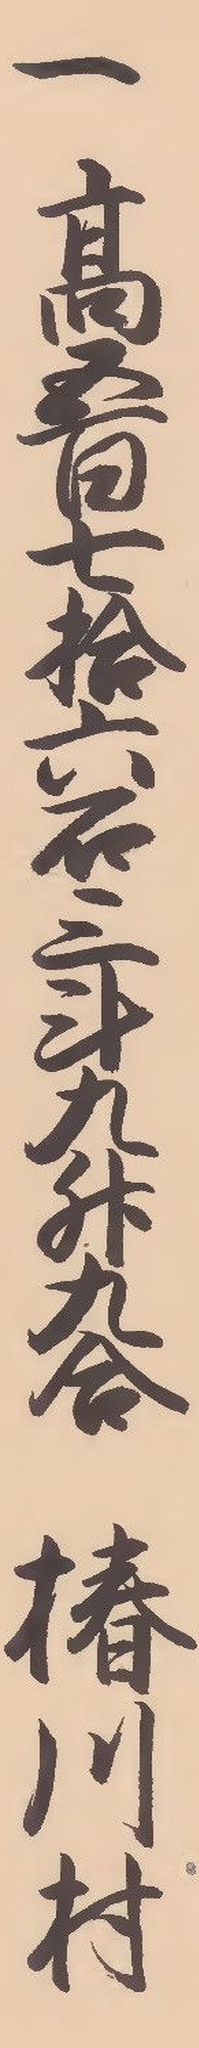一高五百七拾六石三斗九升九合椿川村
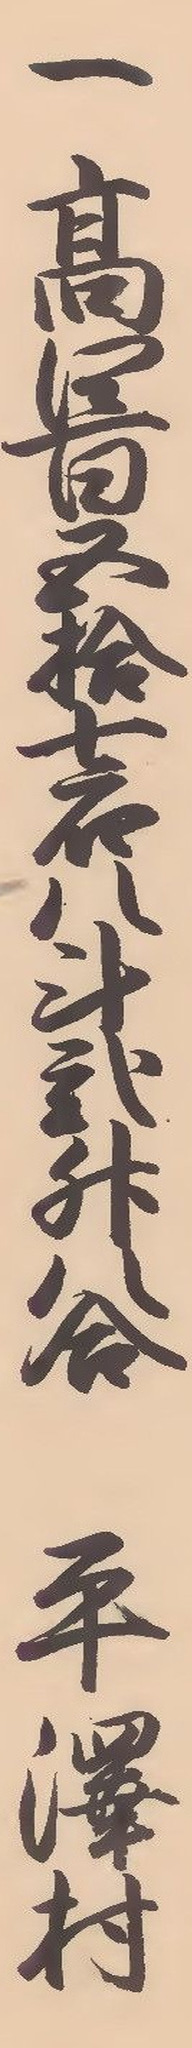一高四百五拾七石八斗弐升八合平沢村

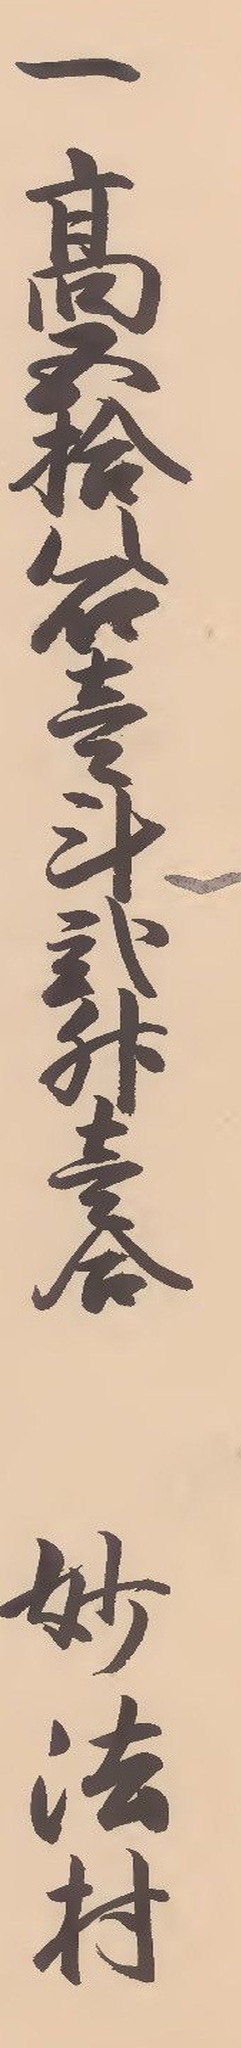一高五拾八石壱斗弐升壱合妙法村
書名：出羽国郷帳　５
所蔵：国立公文書館 National Archives of Japan
